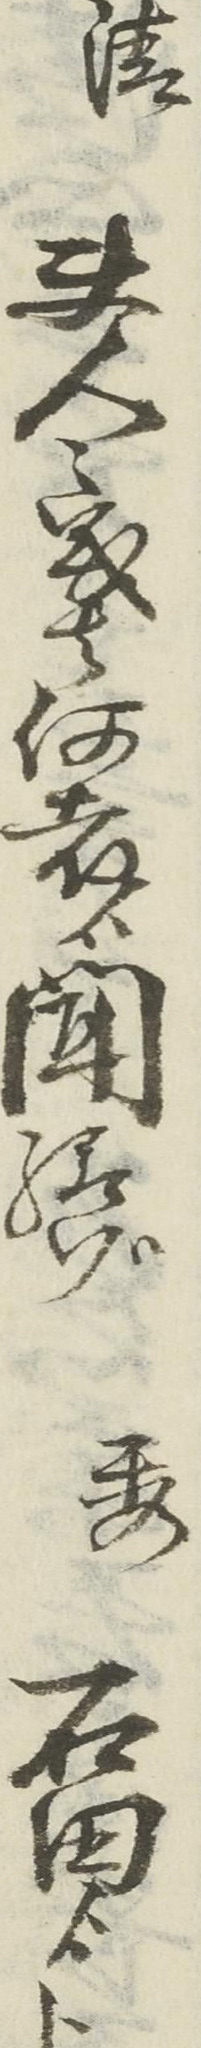清夫人之義は何者ゟ聞く給ゾ秀石田ゟト
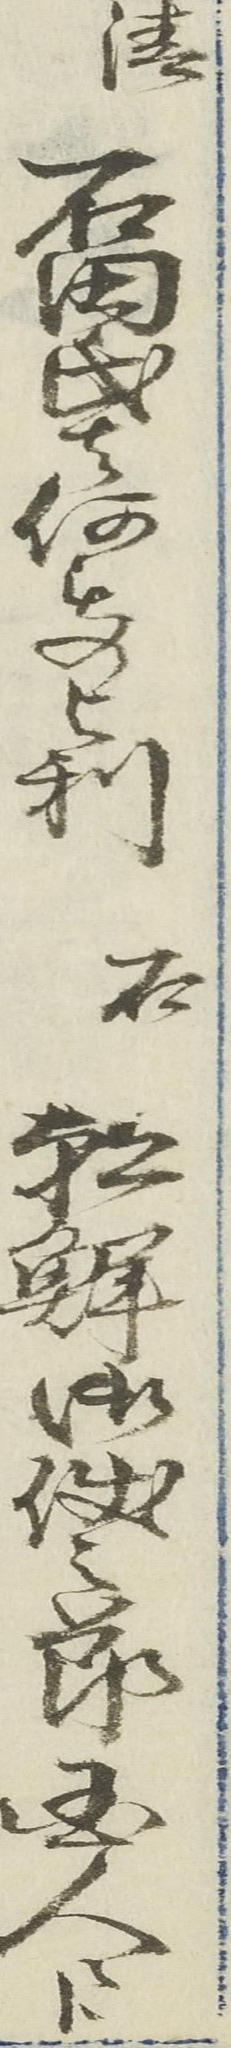清石田氏は何ものよ利石朝鮮御使之節国人ニト
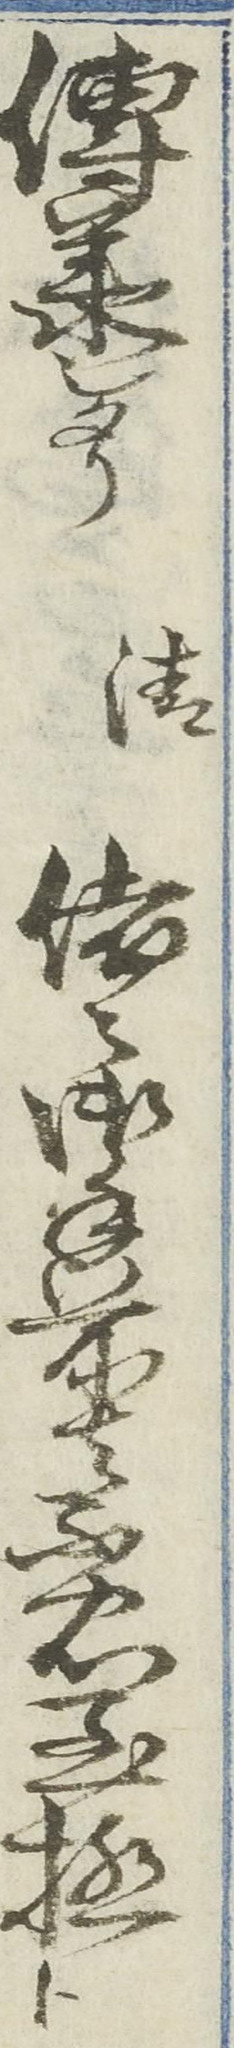傳承シタリ清偖〻御手前は不忠至極ト
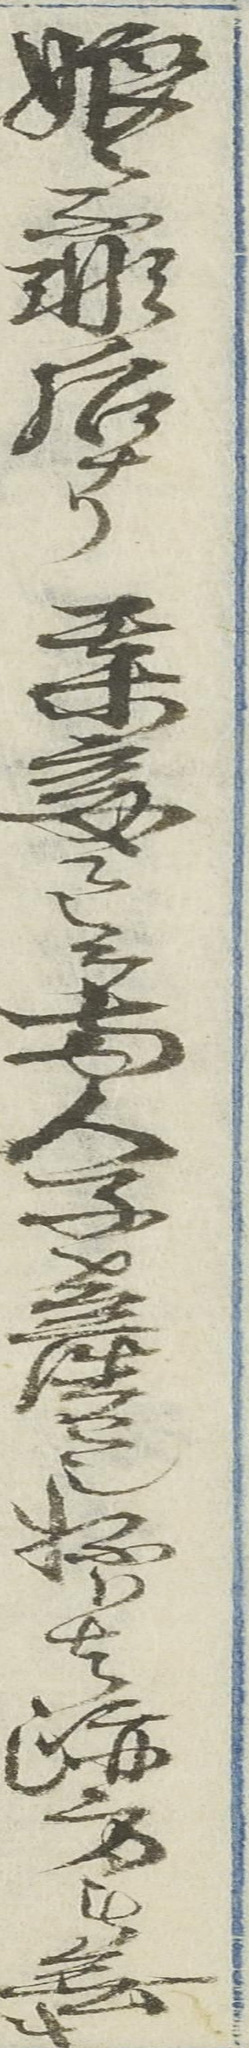娘ニ不非后ナリ某妾ニシテ両人子ヲ産セシ抔トは跡方も無と
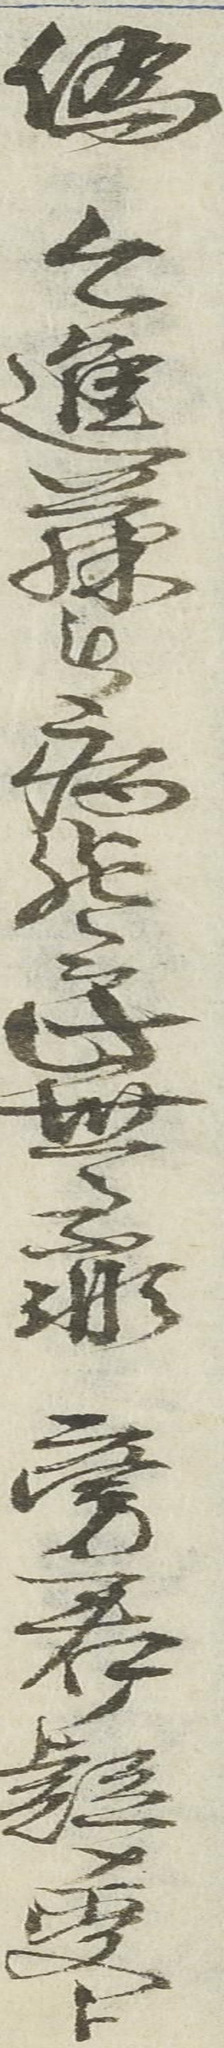偽今進藤も病死シテ此世ニ不非旁君ノ疑ヲ受ト
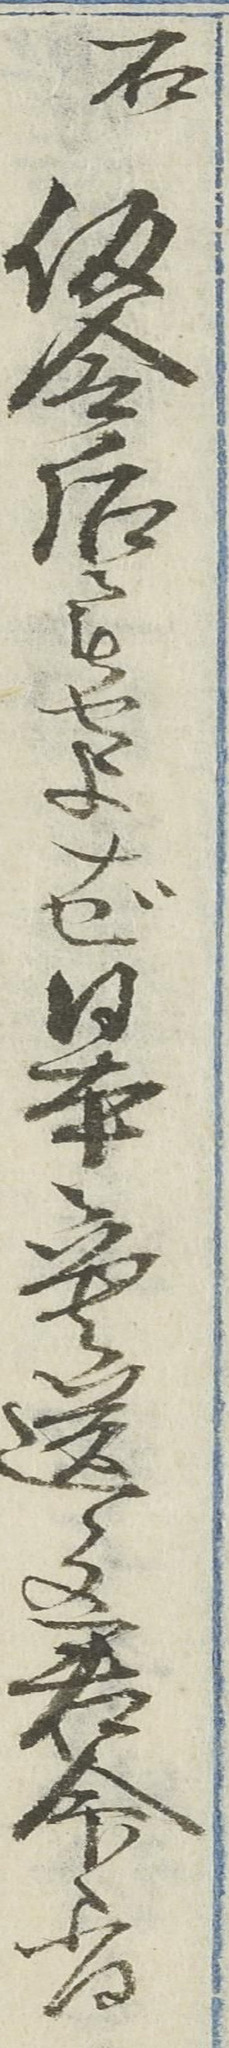石仮令后ニもセよナゼ日本ニ差送ラヌ君令背
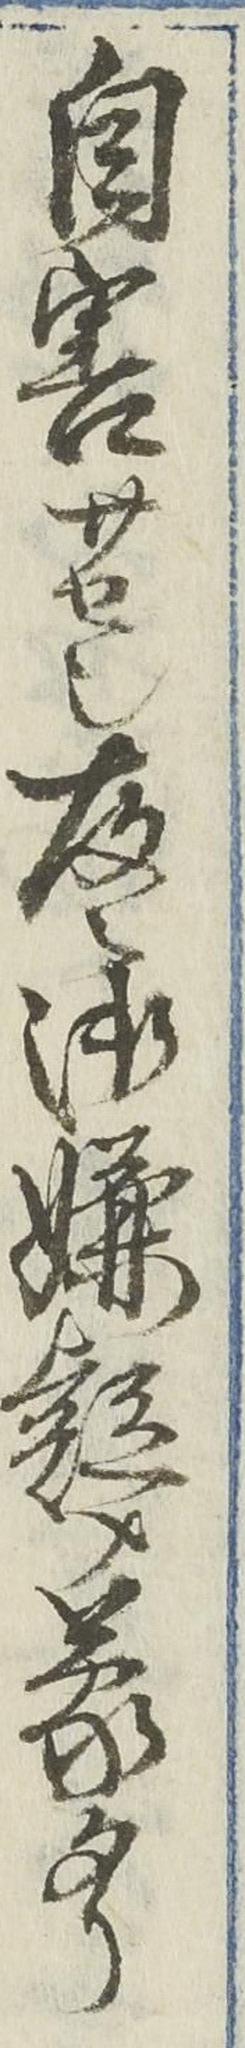自害サセシ故ニ御嫌疑ヲ蒙タリ
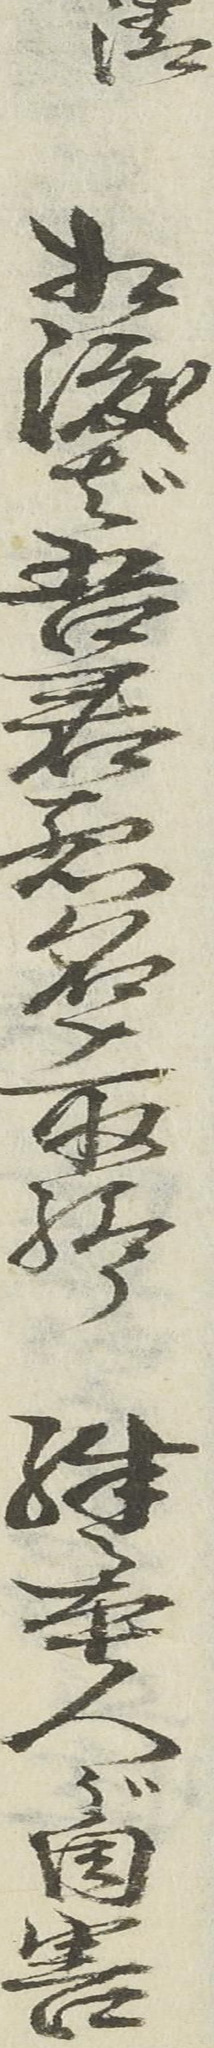清相渡バ吾君悪名ヲ取給ウ殊ニ本人ガ自害
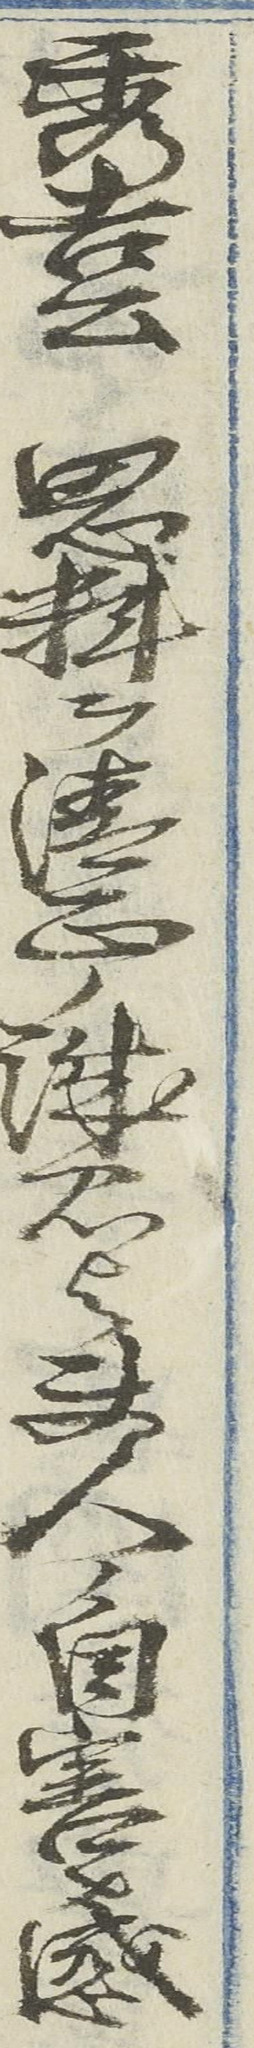秀吉公思料テ清正ノ誠忠と夫人ノ自害ヲ感
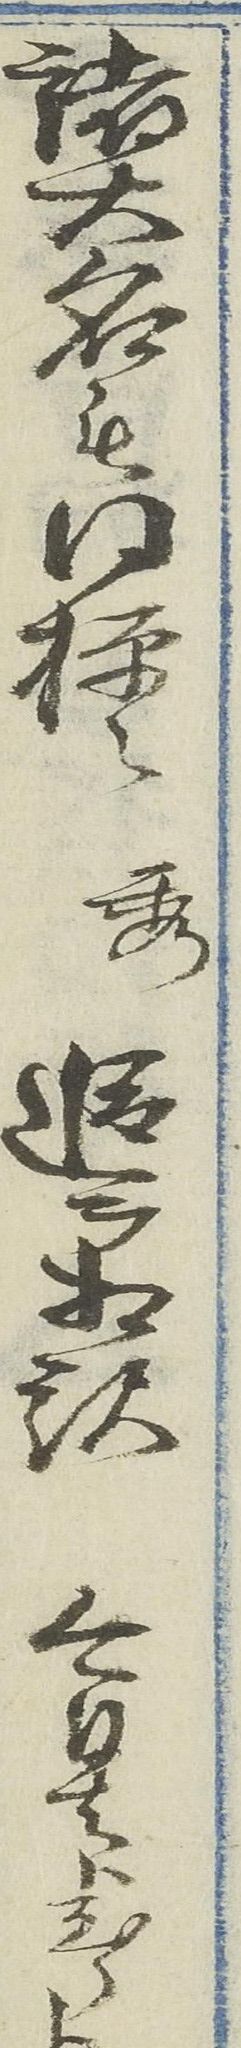諸大名も同様也秀追テ相訳今日はト云うト

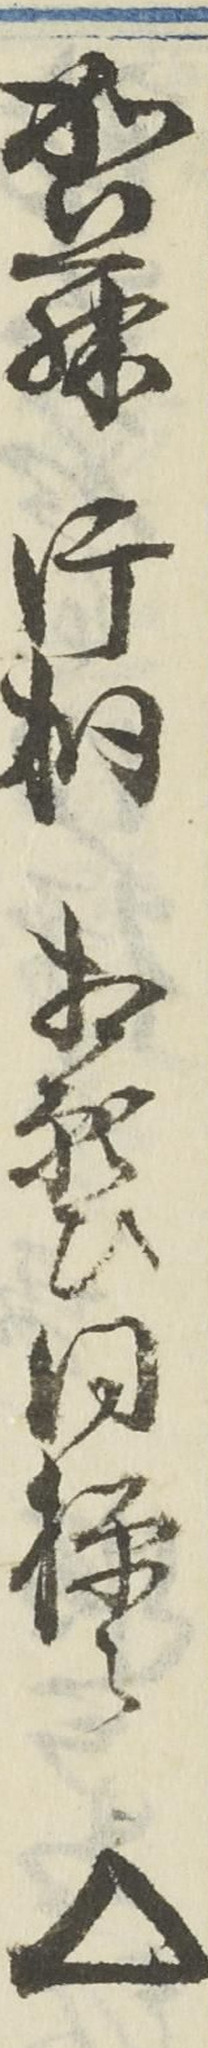加藤片桐相願ひ同様之△
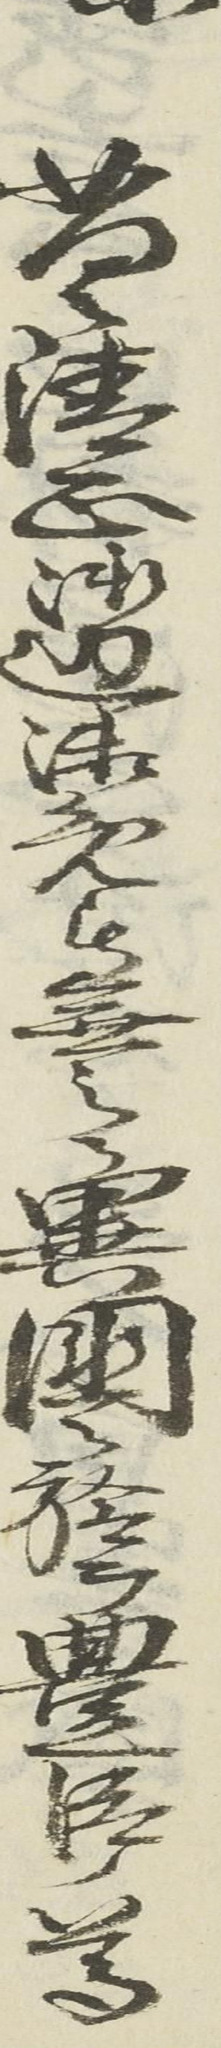小如何二清正御辺御免も無之テ異国二於テ豊臣ノ尊
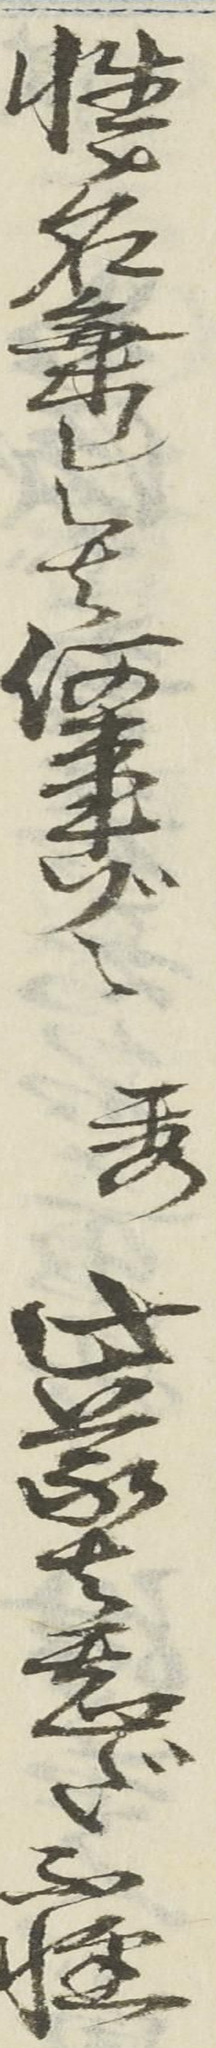性ヲ名乗レしは何事ゾ之秀此義は甚だ不軽
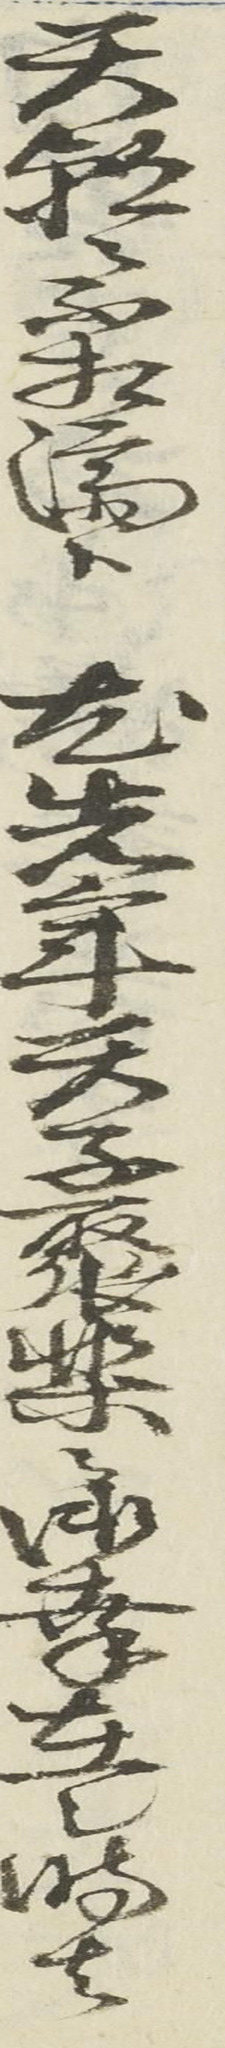天朝二不相済ト尤先年天子聚楽二御幸在し時は
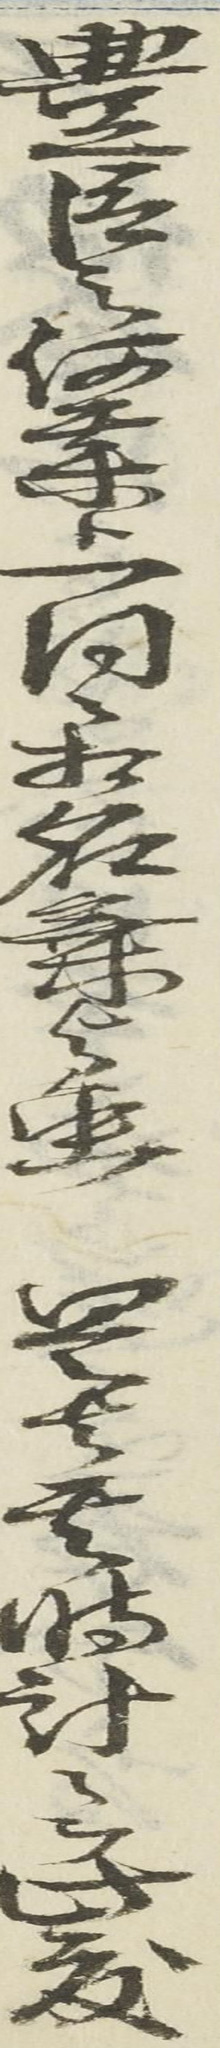豊臣之何某ト一同へ相名乗と雖是は其時計二テ此度
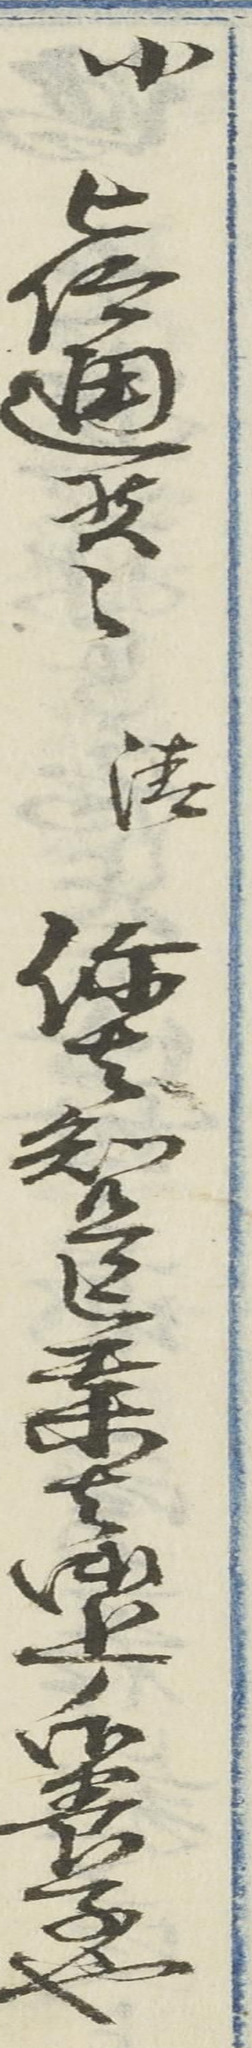小被仰通候之清你は知ㇽ可し某は御上ノ御養子也
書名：伏水大地震
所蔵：東京大学地震研究所図書室 Earthquake Research Institute Library, The University of Tokyo, JAPAN
